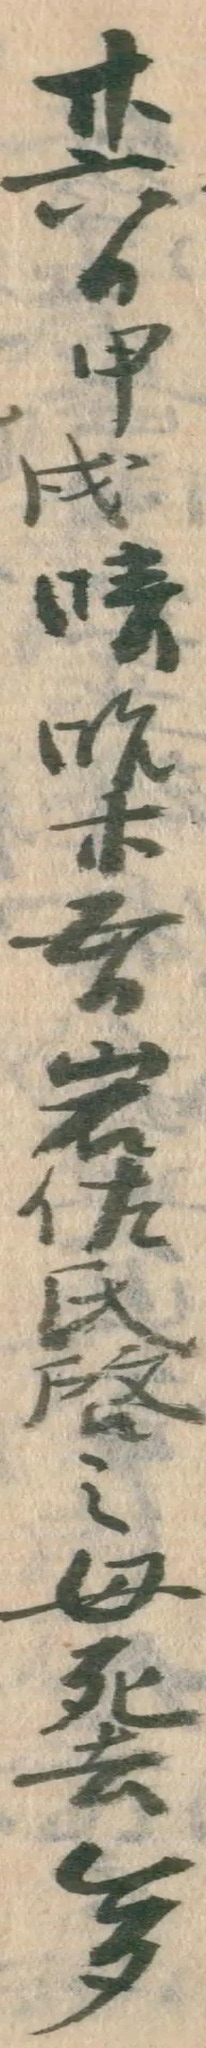廿六日甲戌晴、昨廿五日、岩佐氏啓之母死去、今夕
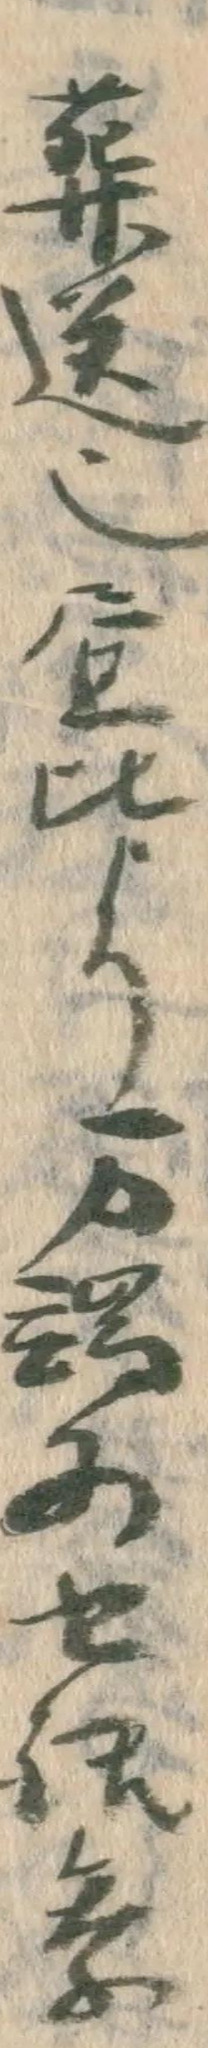葬送也、昼比より万端に世話参、
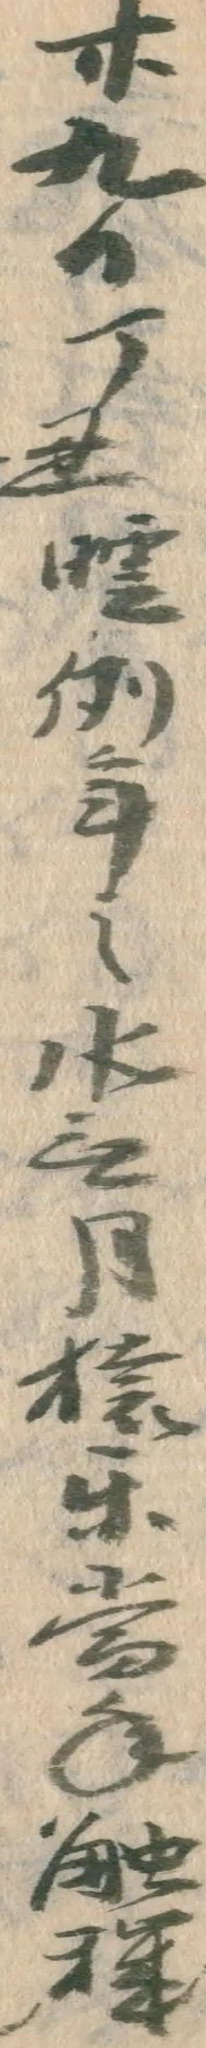廿九日丁丑晴、例年之水無月猿楽、當年触穢
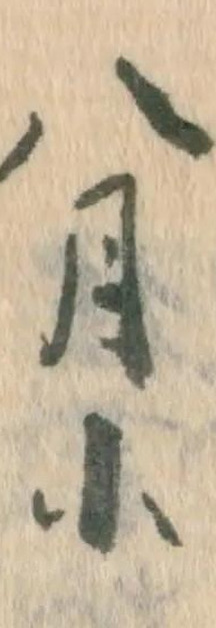八月小
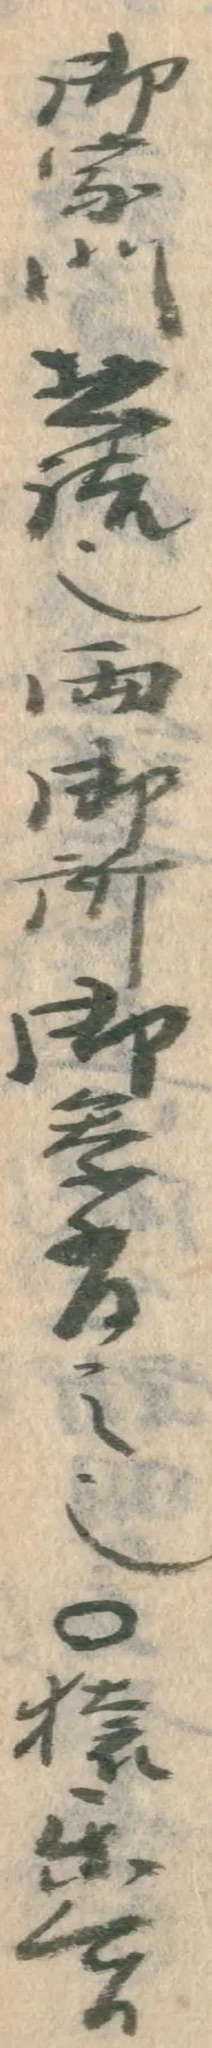御家門惣詰也、両御所御参有之也、○猿楽今日

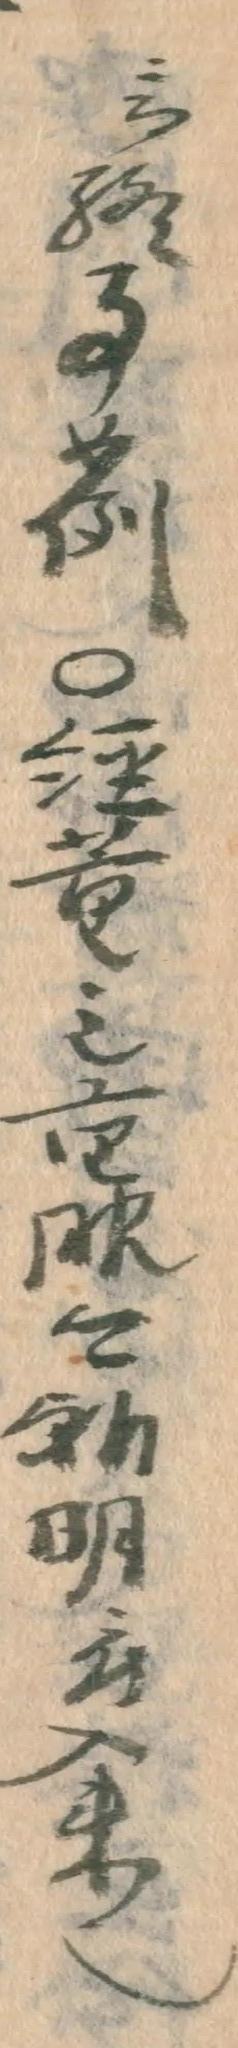ニ而終事如例、○経董之重眼今朝明ニ付入来也、
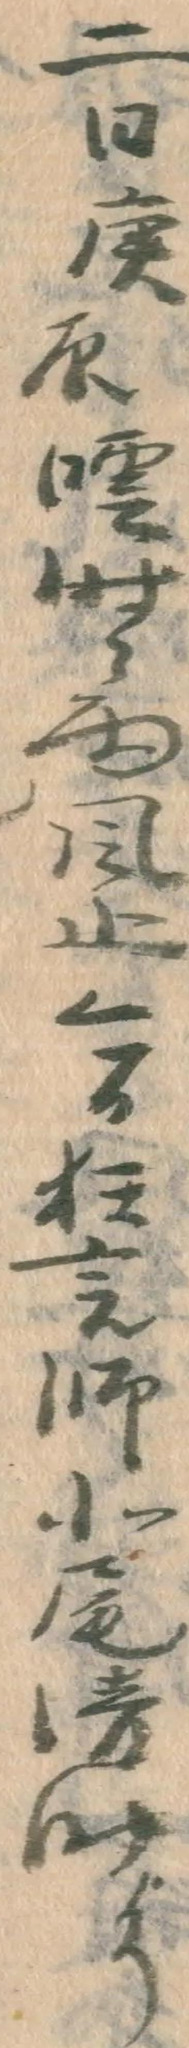二日庚辰雲時〻雨風止、今日狂言師北尾清助より
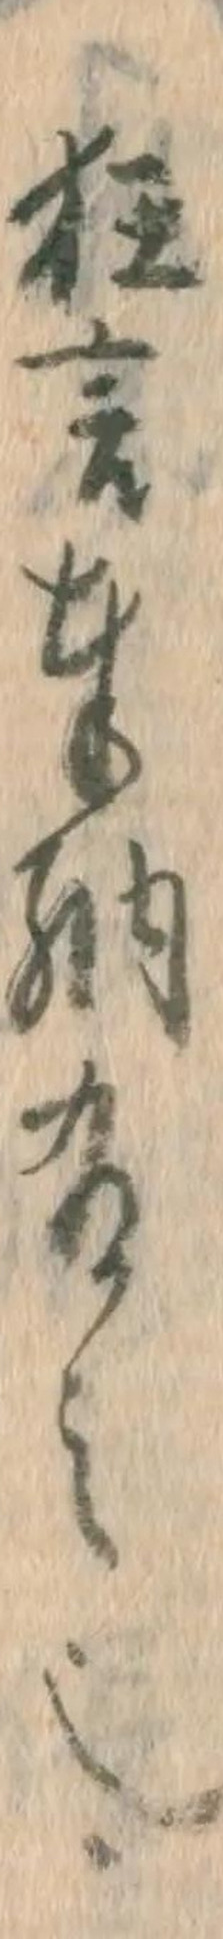狂言奉納有之也、
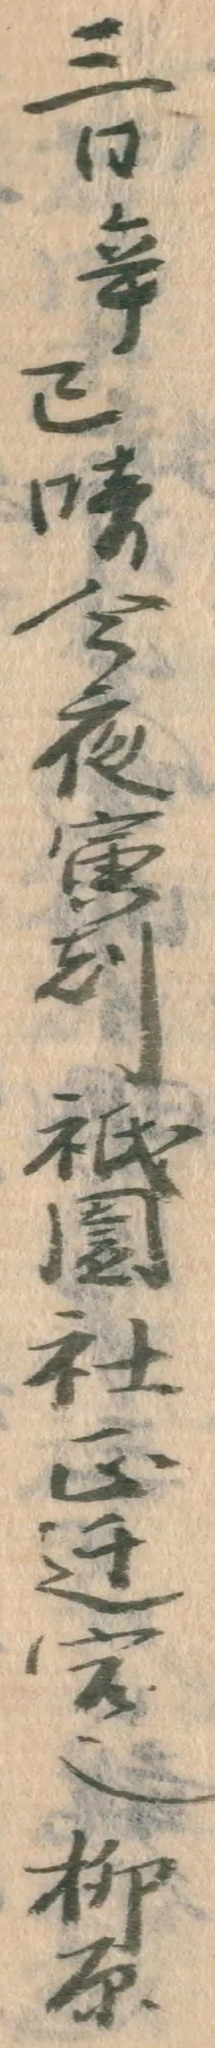三日辛巳晴、今夜寅刻祇園社正遷宮也、柳原
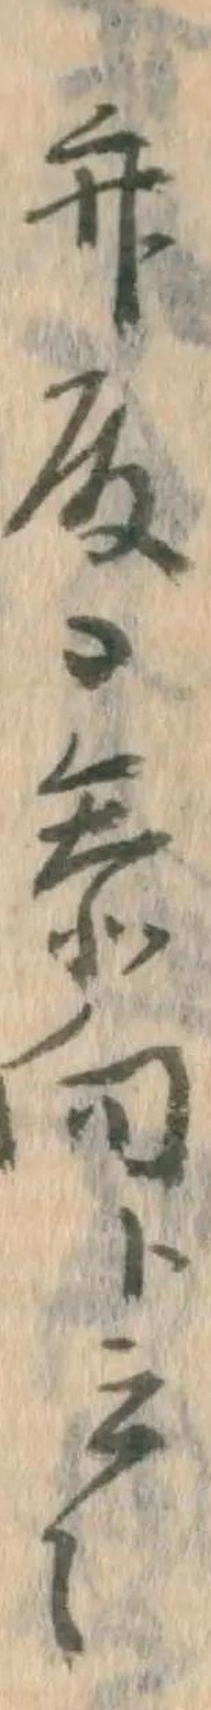弁殿御参向と云々、
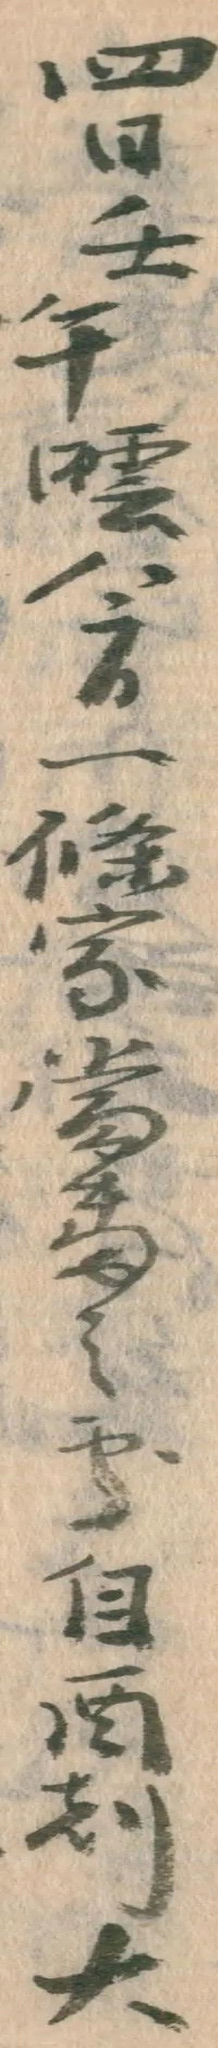四日壬子曇、今日一條家當番之處、自酉刻大
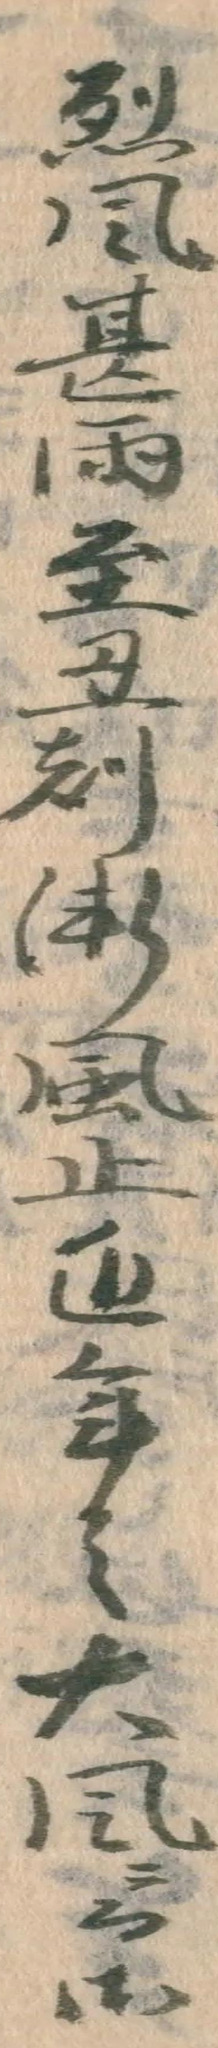烈風甚雨、至丑刻漸風止、近年之大風ニ而御
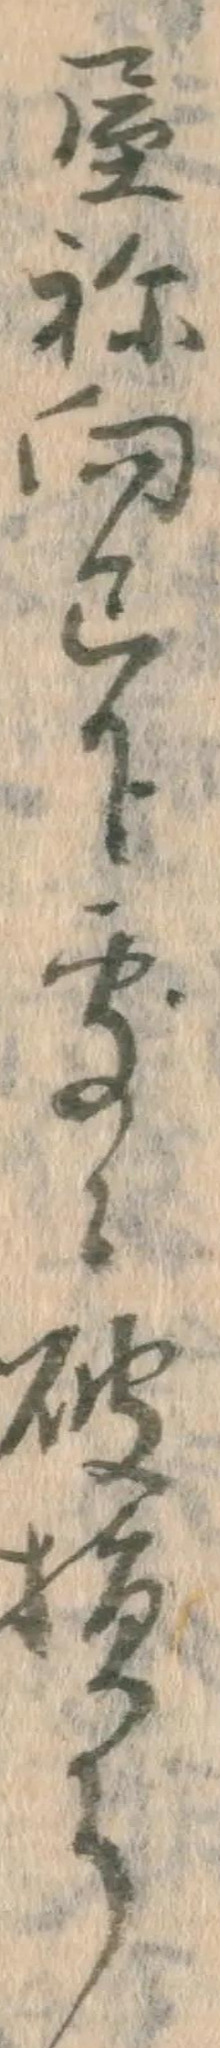屋祢向已下處々破損了、
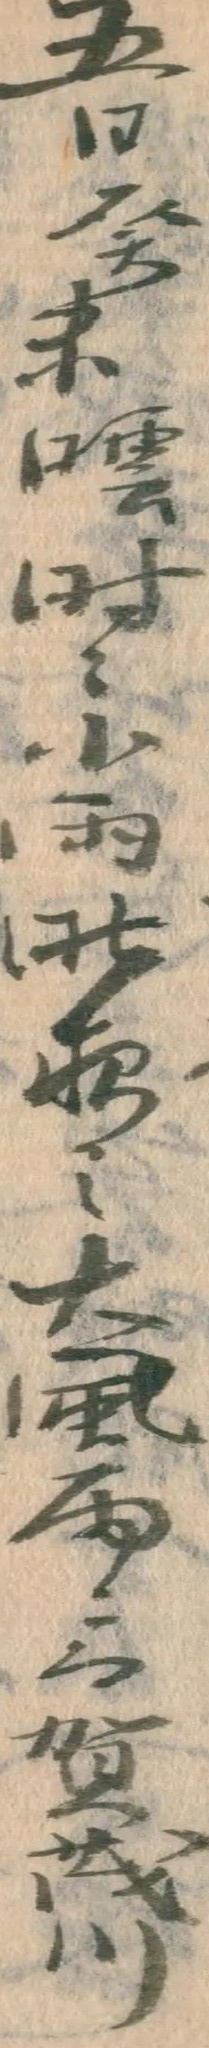五日癸未曇時々小雨、昨夜之大風雨二而、賀茂川
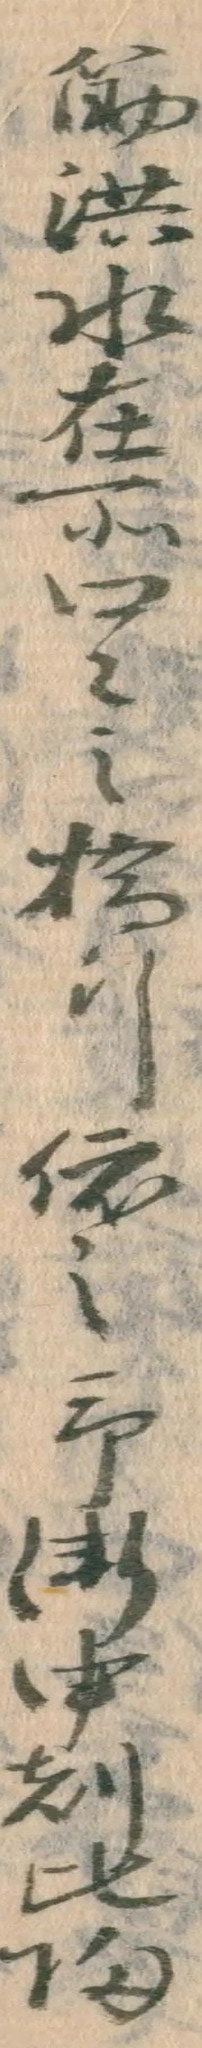筋洪水在所口〻之橋引依之、予漸申刻比帰、
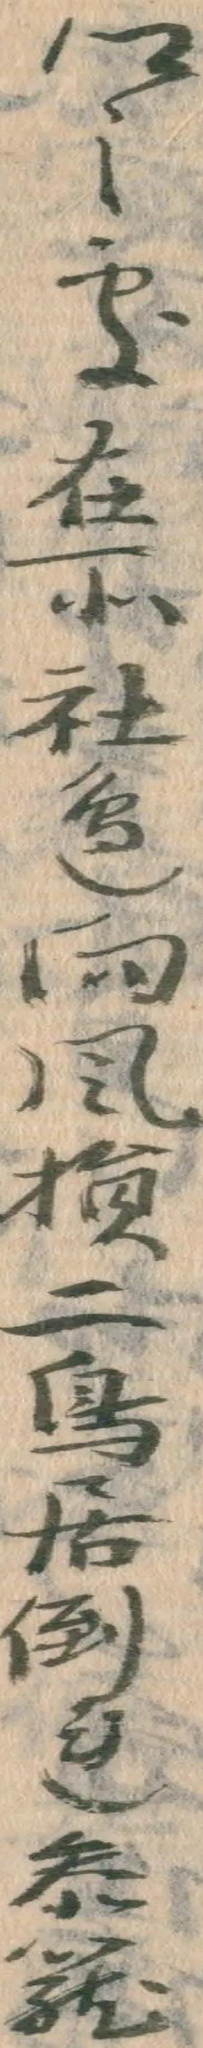郷之處在所・社辺向風損、二鳥居倒れ、参籠
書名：賀茂社記録. 第63冊
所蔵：国立国会図書館 National Diet Library, JAPAN
